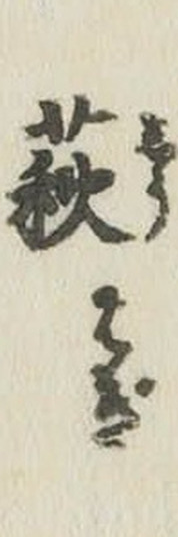萩はぎ
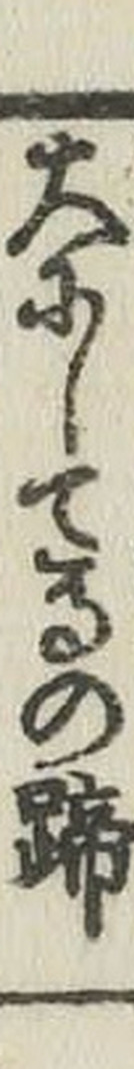大にして馬の蹄
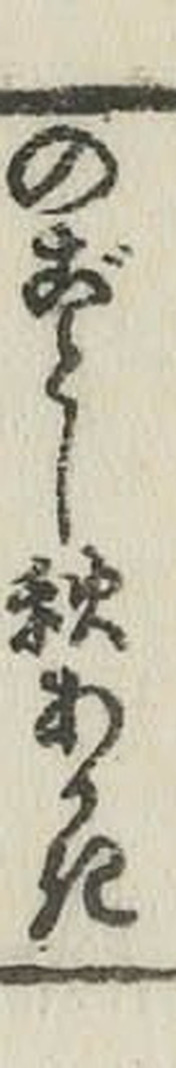のごとし秋あかき
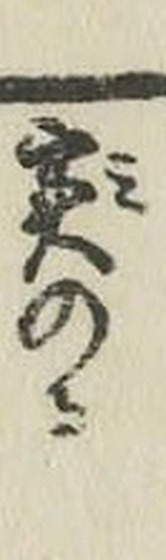実のる
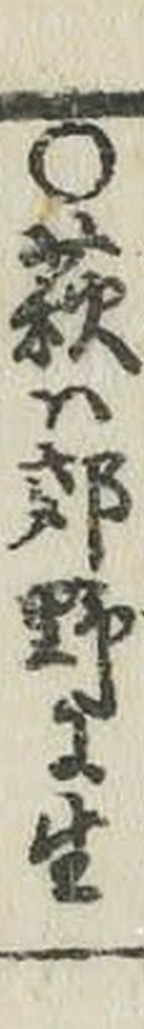○萩は郊野に生
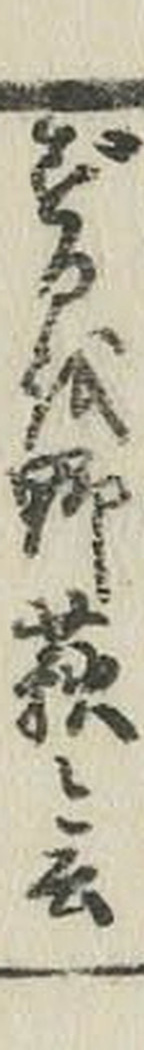ずるを野萩と云
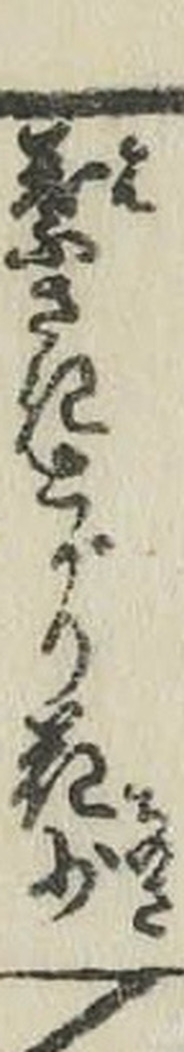葉さきとがり花小
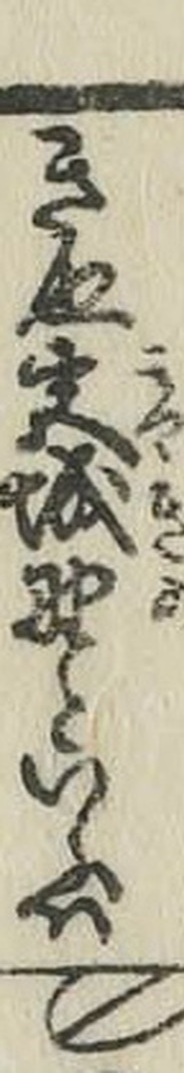き也宮城野といふは
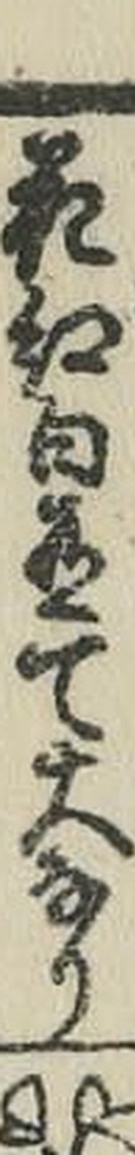花紅白有て大なり

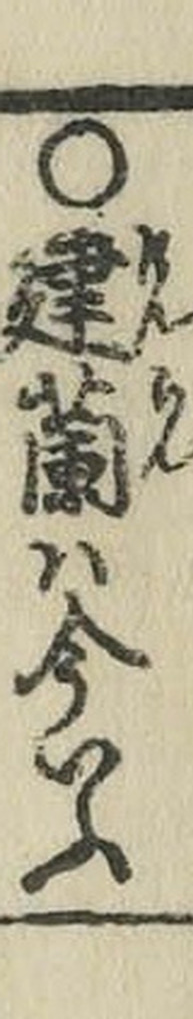○建蘭は今いふ
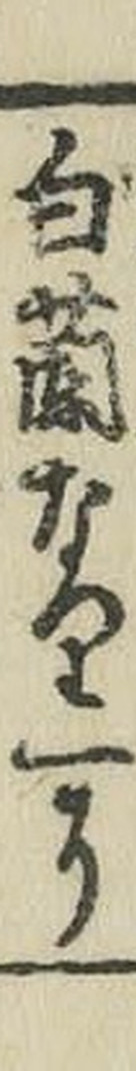白蘭なり一に
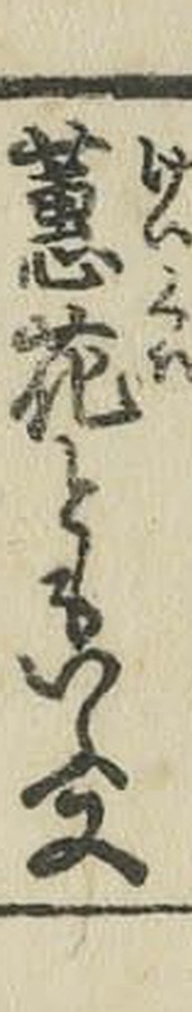蕙花ともいふ又
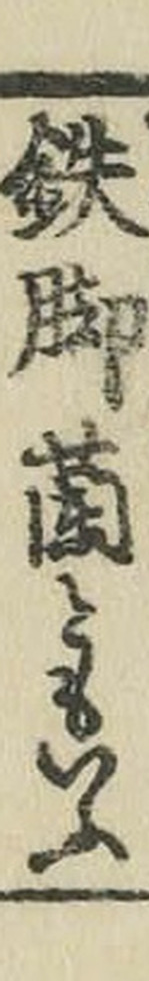鉄脚蘭ともいふ
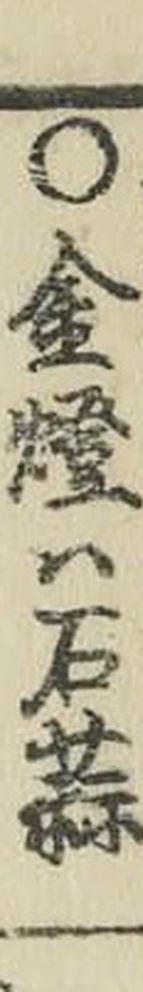○金燈は石蒜
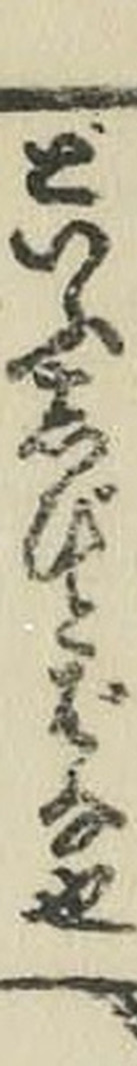といふしびとばな也
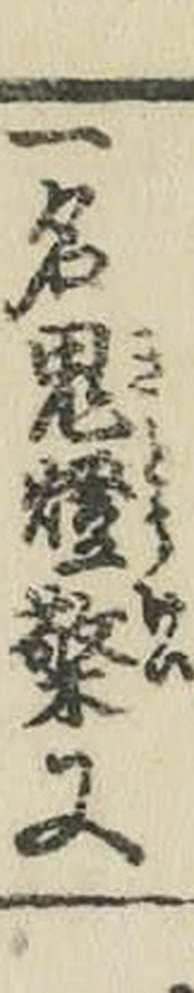一名鬼燈檠又
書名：増補頭書訓蒙図彙大成 10巻 9:巻之20
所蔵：東京学芸大学教育コンテンツアーカイブ
